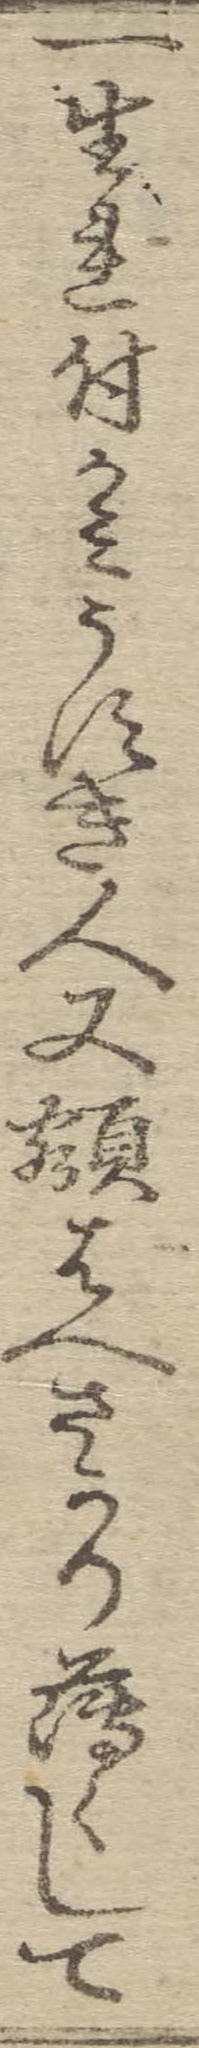一生れ付かみうすき人又額はへさかり薄くして
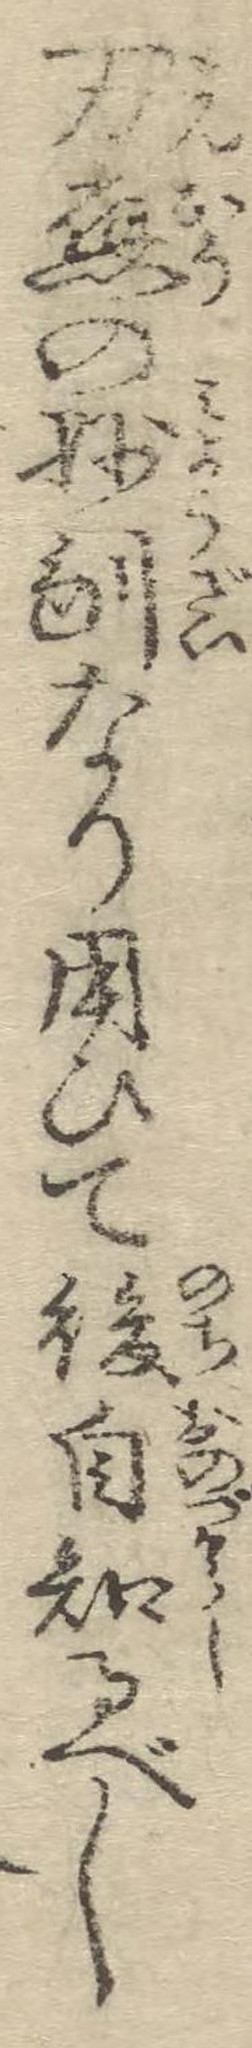万応の妙劑なり用ひて後自知るべし
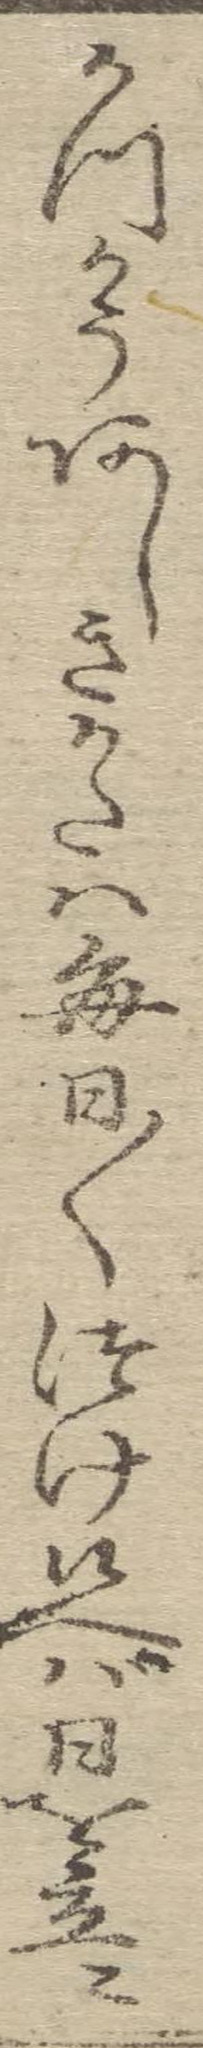かつかうあしきかたは毎日〳〵つけ候へば日を立に
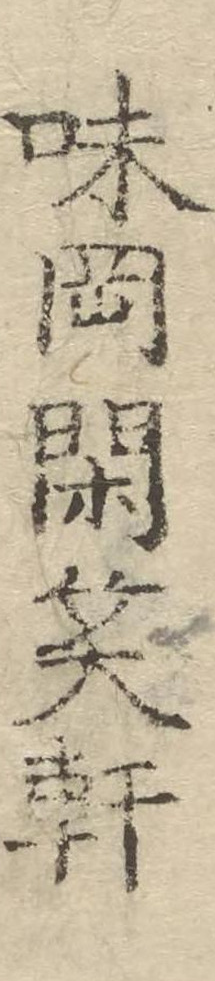味岡閑笑軒
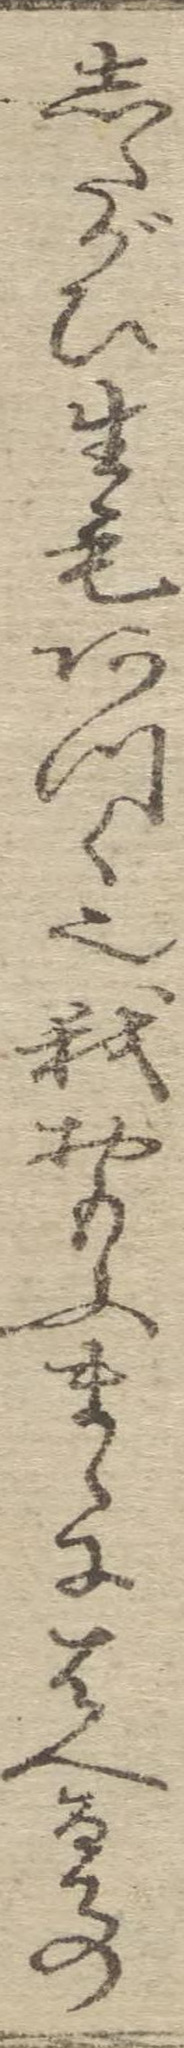したがひ生毛あつく也我おもふまゝにはへる事
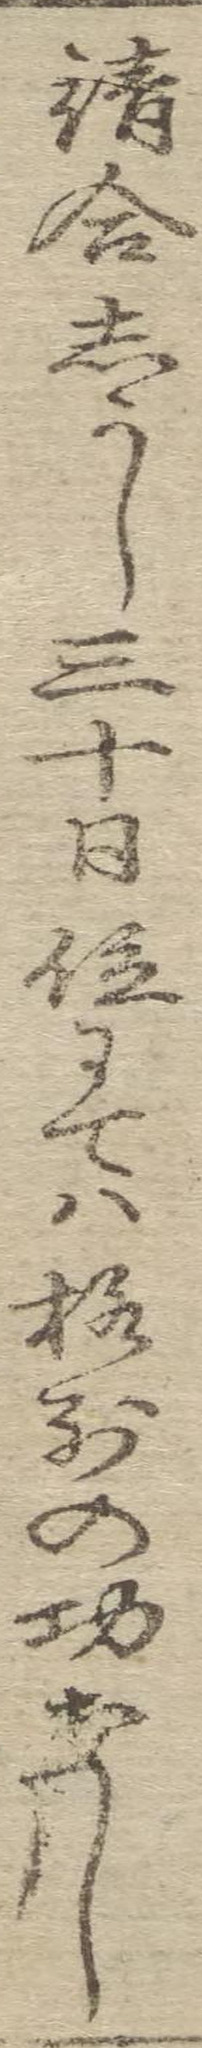請合しかし三十日位にては格別の功なし
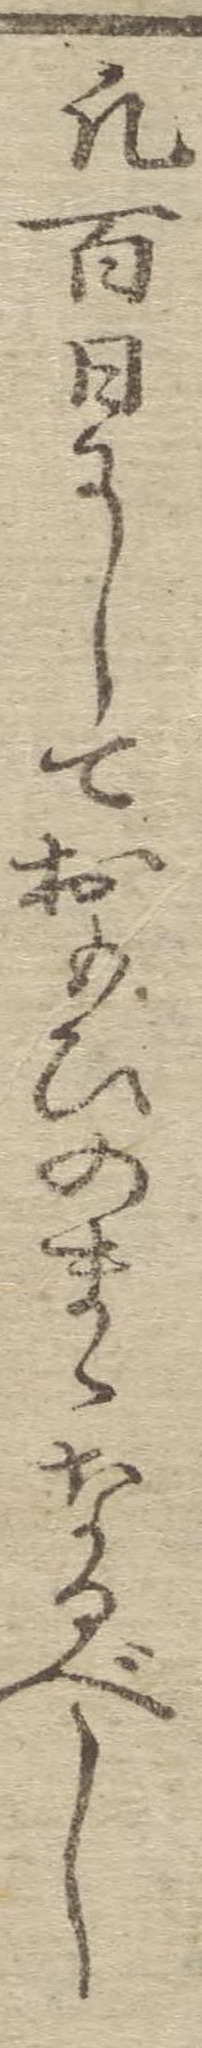凡百日にしておもひのまゝなるべし
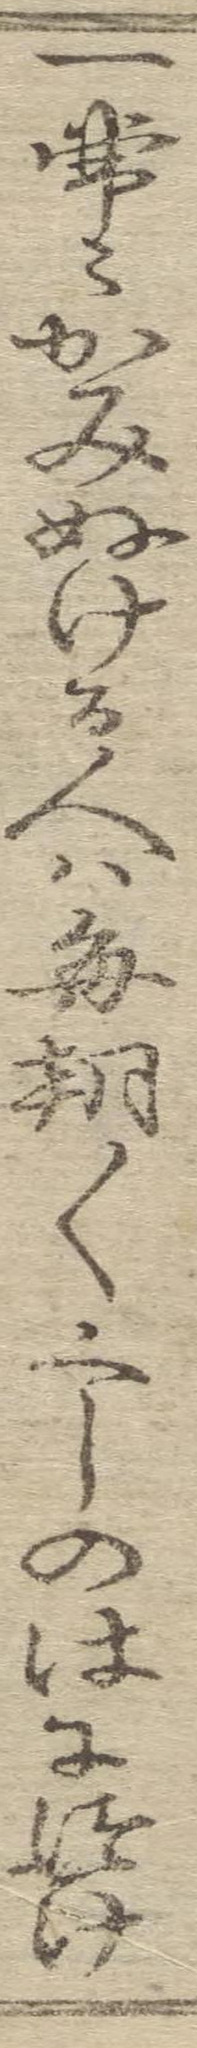一常々かみぬける人は毎朝〳〵くしのはにつけ
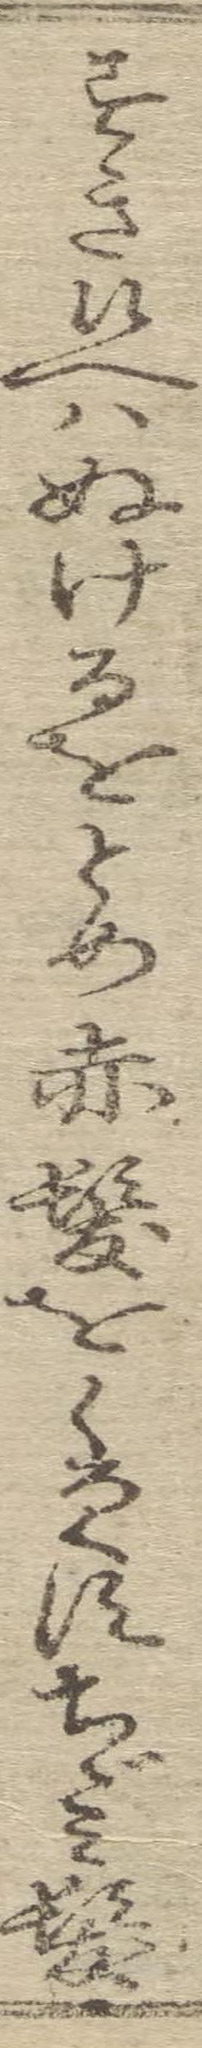すき候へはぬけるをとめ赤髪をくろくすちゞみ髪
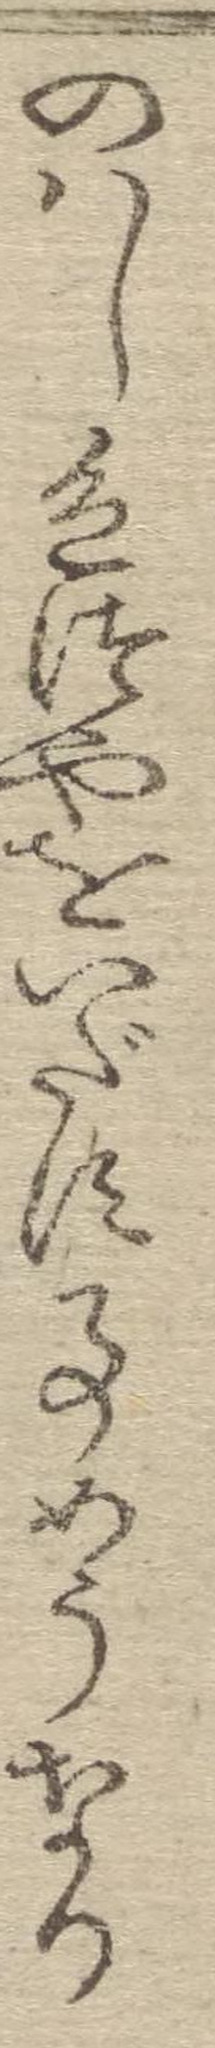のはし色つやをいだす事めうなり
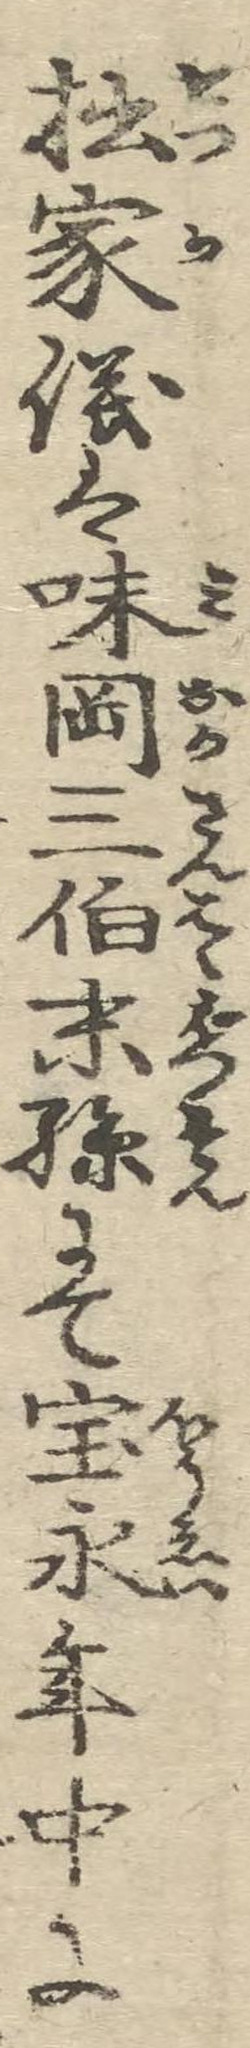拙家儀は味岡三伯末孫にて宝永年中に
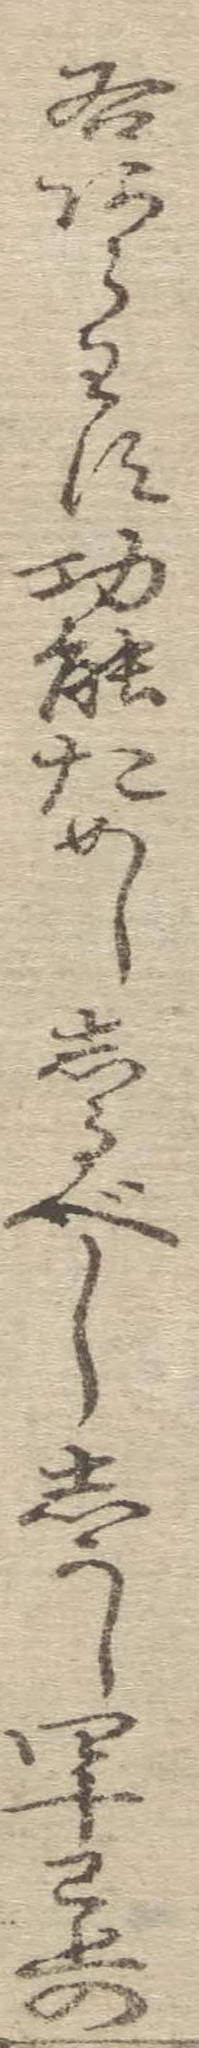右あらわす功能ためししるべししかし四十已上の
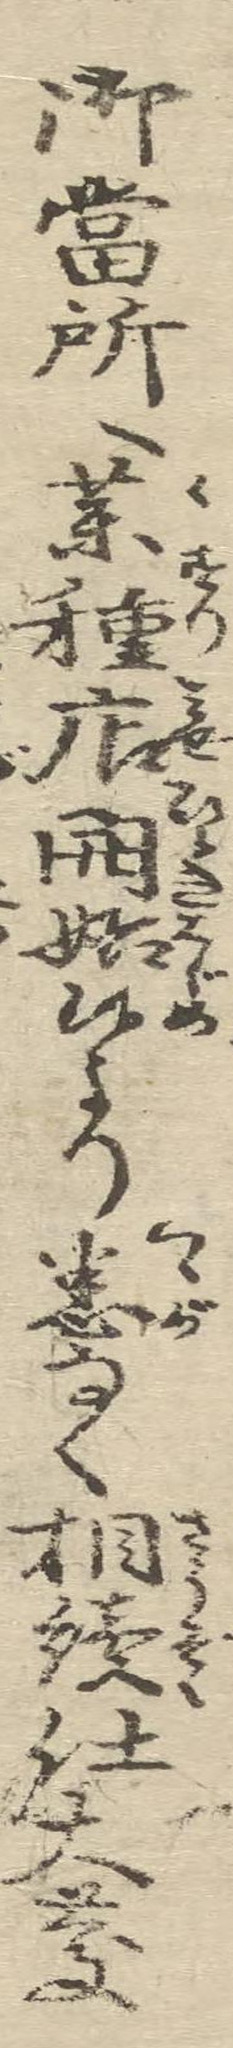御当所へ薬種店開始候より恙なく相続仕大慶
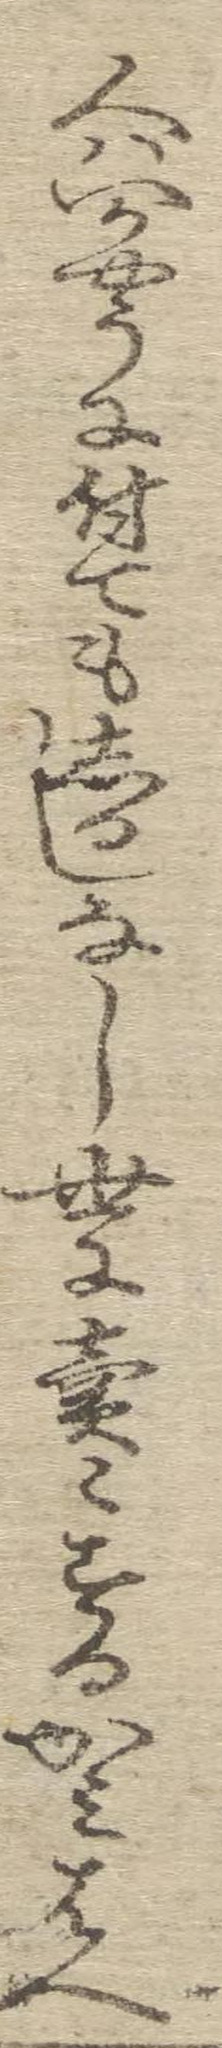人はいかやうに付てもしるしなし世に売々するかみはへ
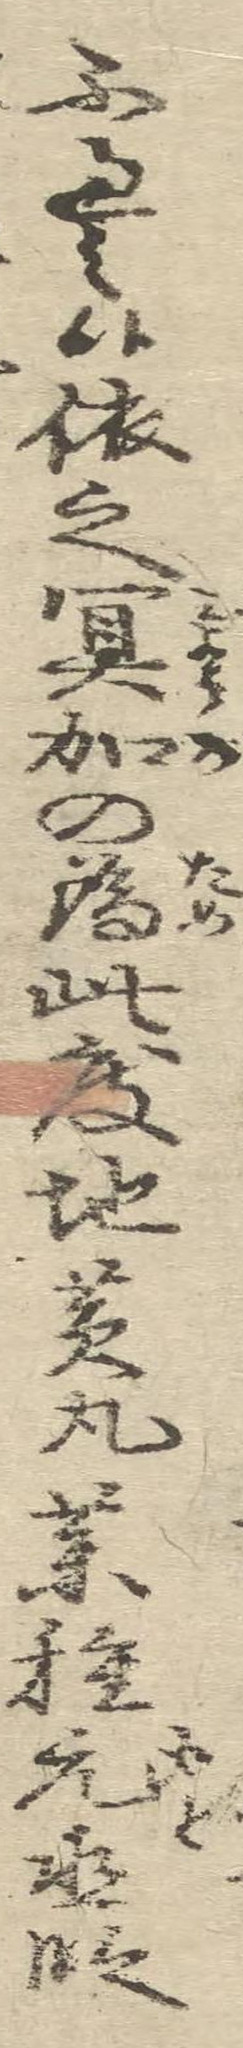不過之候依之冥加の為此度地黄丸薬種元直段
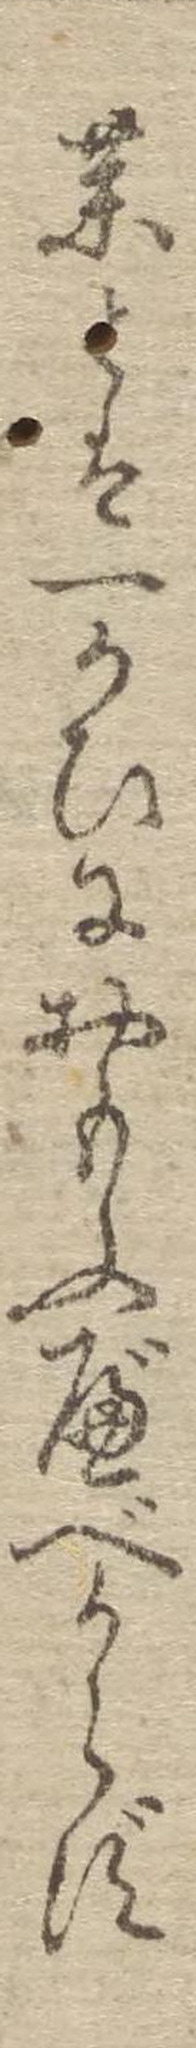薬とは一かひにおもふ遍べからず
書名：浪華薬種問屋能書張交帖. 二
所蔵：国立国会図書館 National Diet Library, JAPAN
